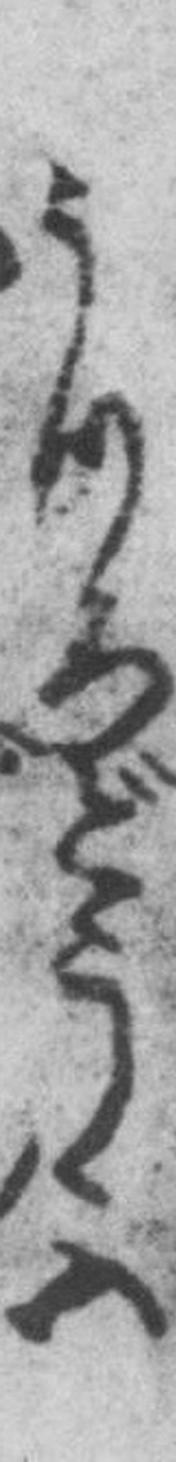うつろどうふ
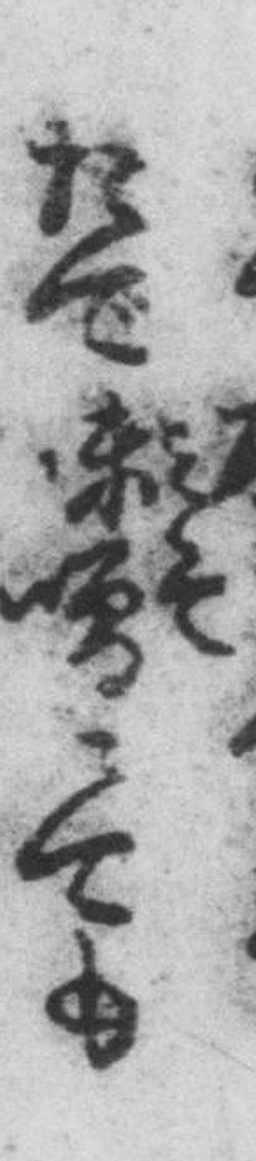たで味噌にても
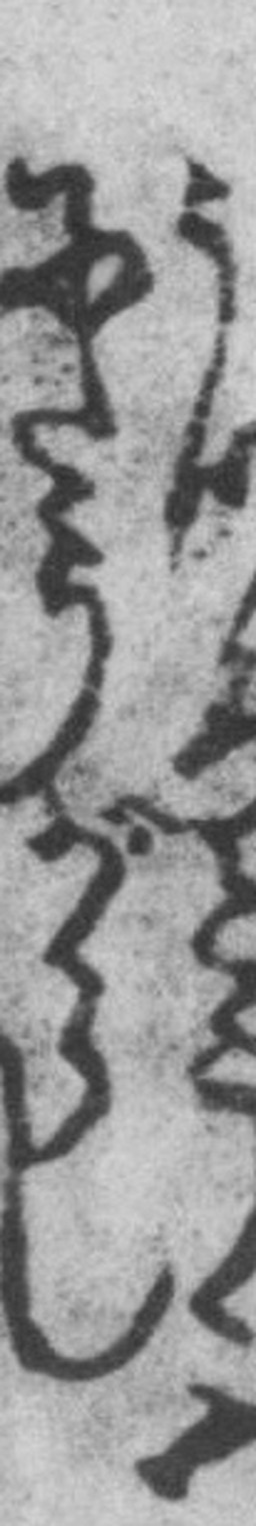にたうがらし
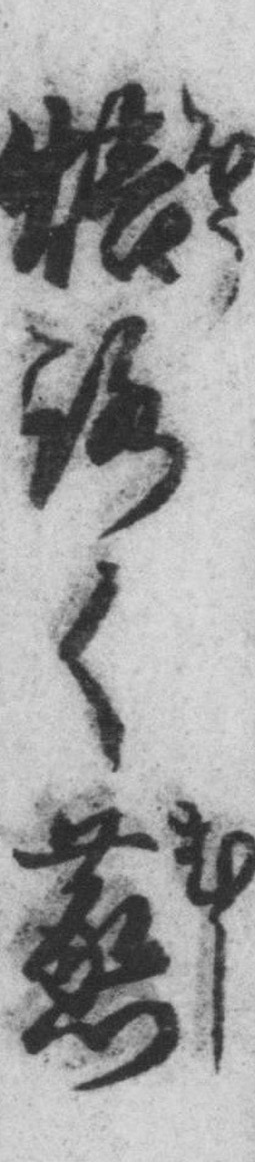焙ろく蒸

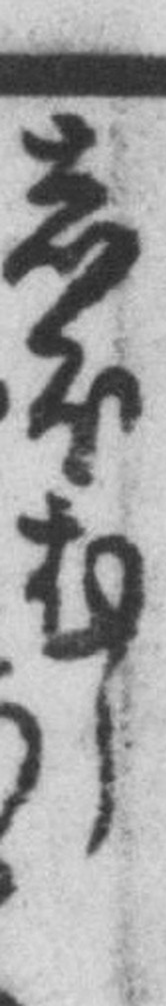しほむし
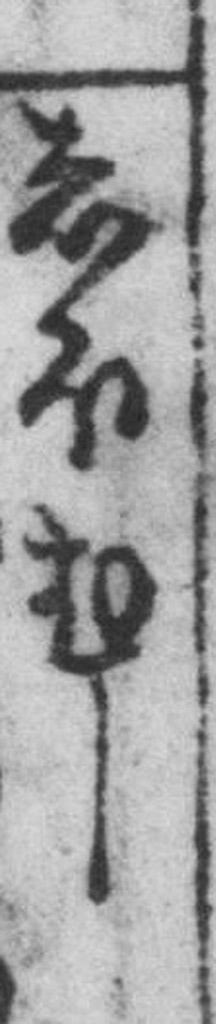しほむし
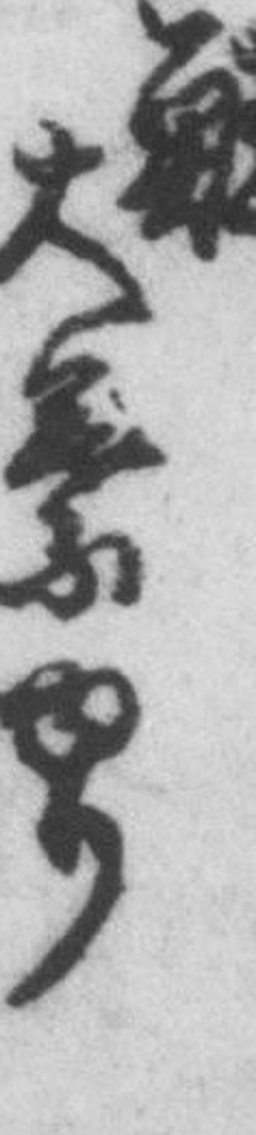大葉ゆり
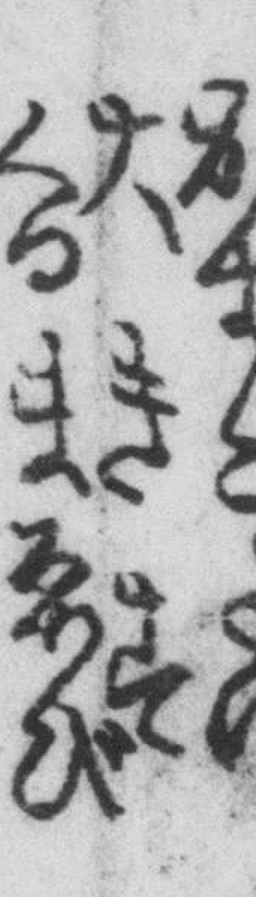くるまゑび
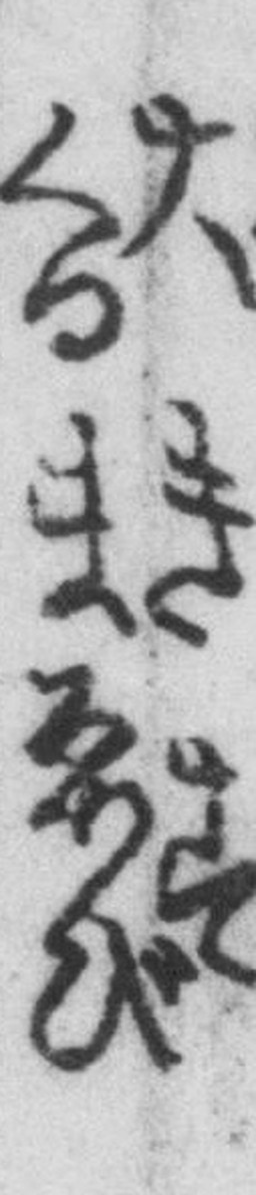くるまゑび
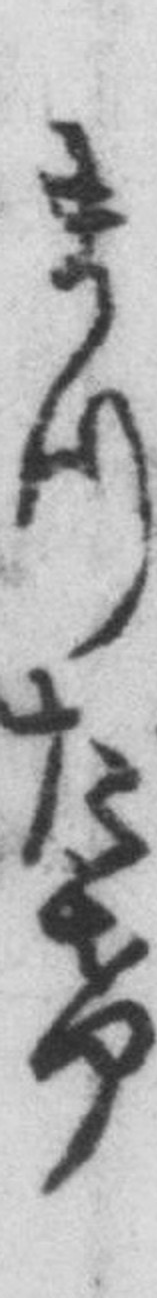はつたけ
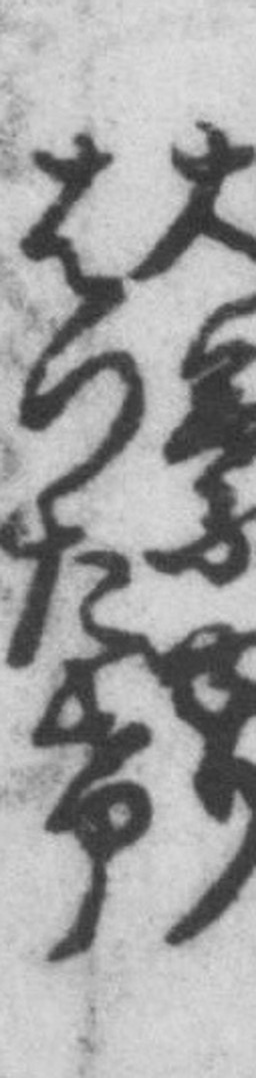はつたけ
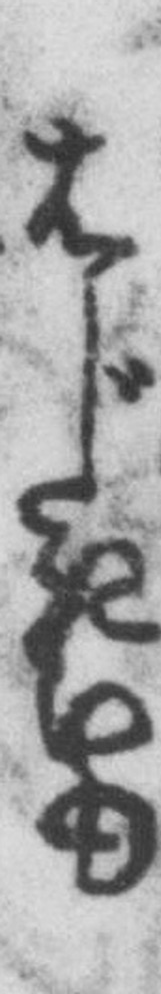はじきいも
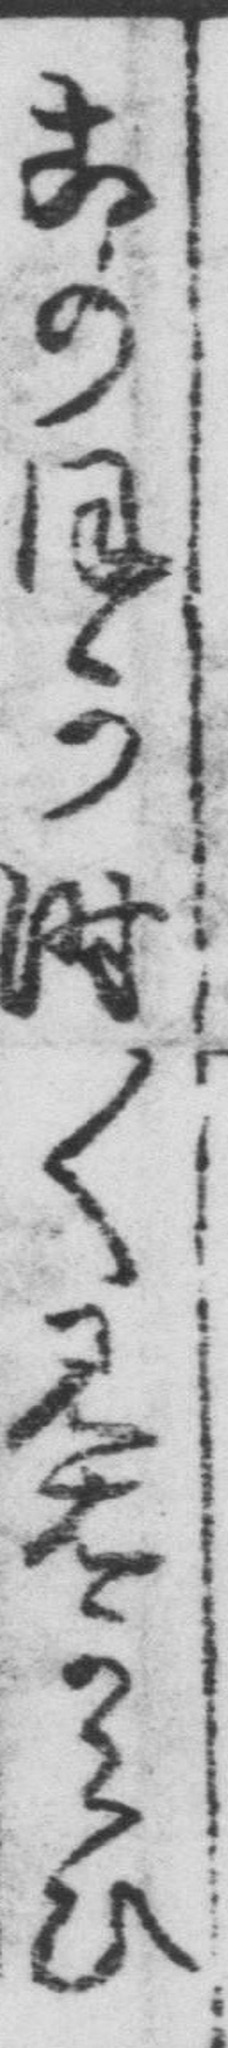このの時々見はからひ
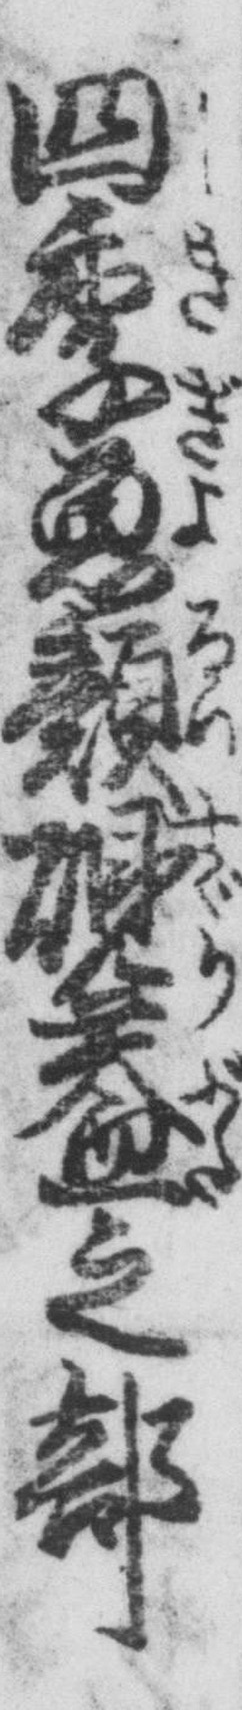四季魚類硯蓋之部
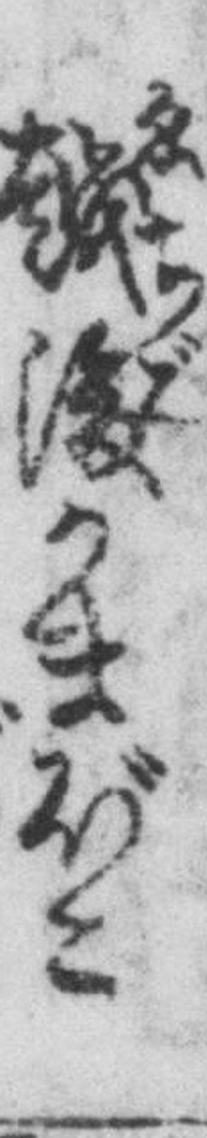まきかまぼこ
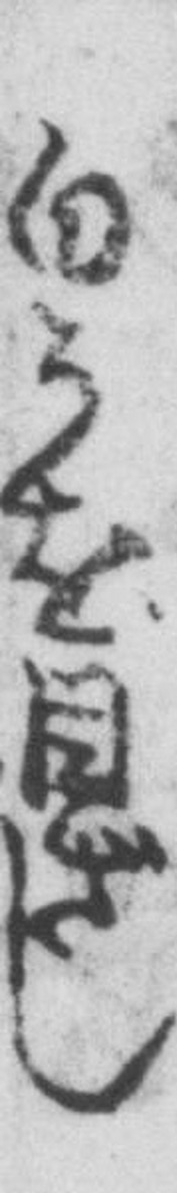白うを目ざし
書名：即席庖丁
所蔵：大阪府立大学学術情報センター 国文学研究資料館
